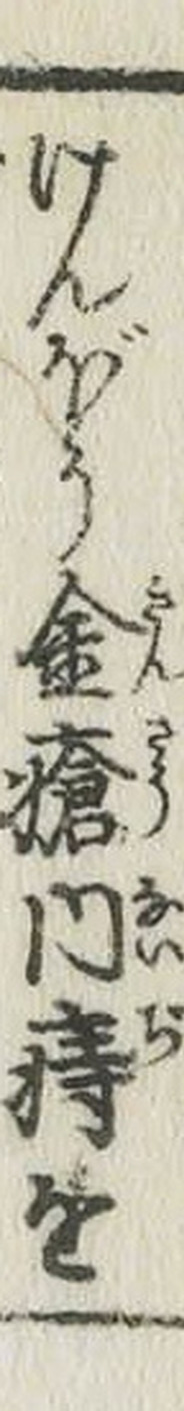けんぼう金瘡内痔を
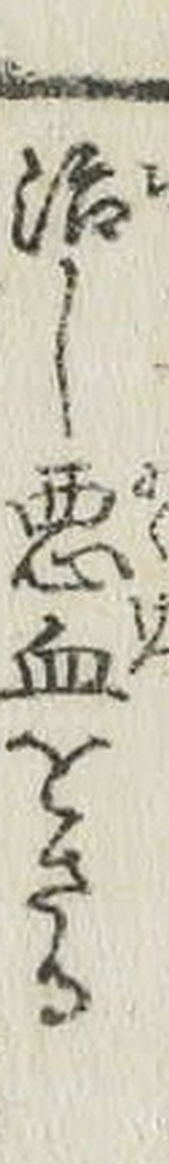治し悪血をさる
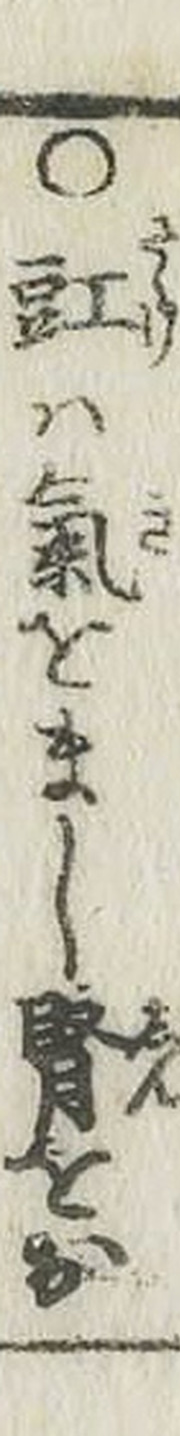○豇は気をまし腎をお
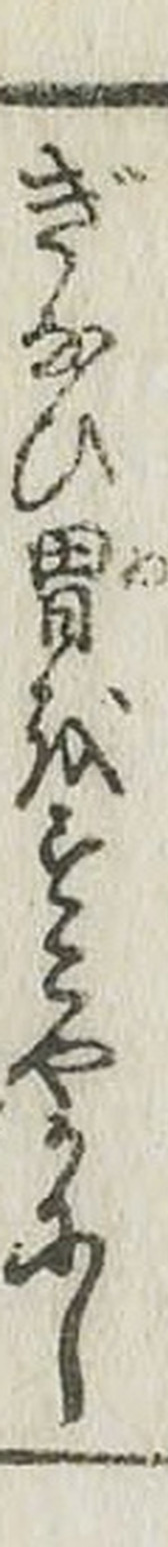ぎなひ胃をすこやかにし
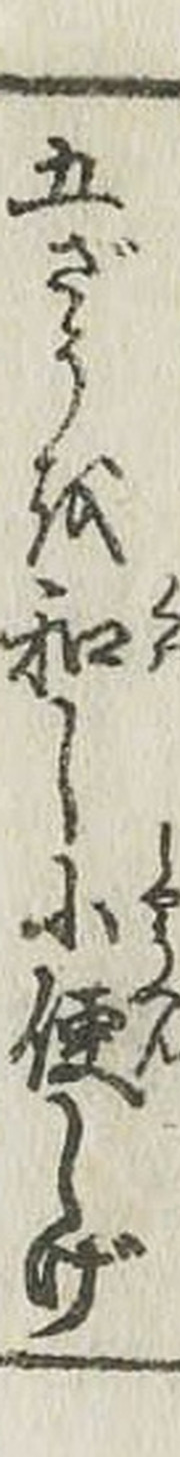五ざうを和し小便しげ
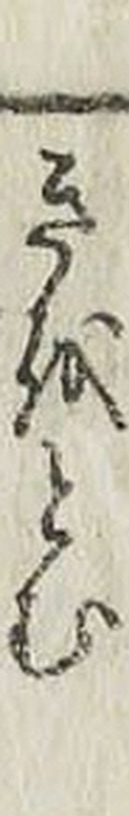きをとむ
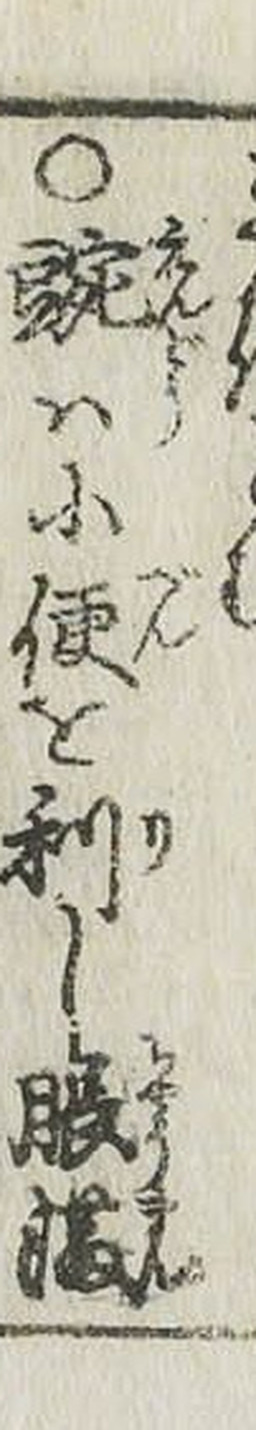○豌は小便を利し脹満
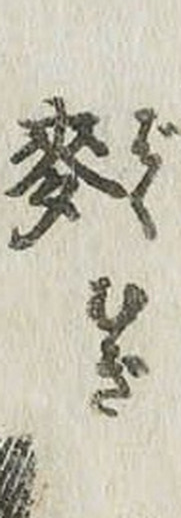麦むぎ
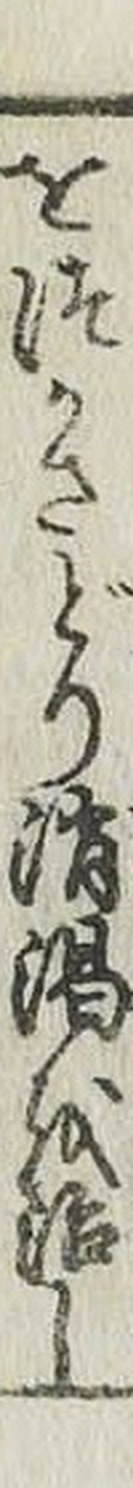をつかさどり消渇を治し
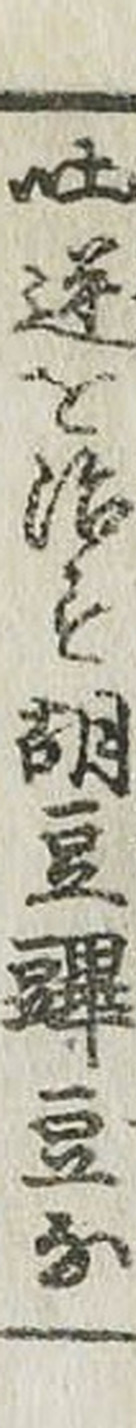吐逆を治す胡豆𧰆豆な
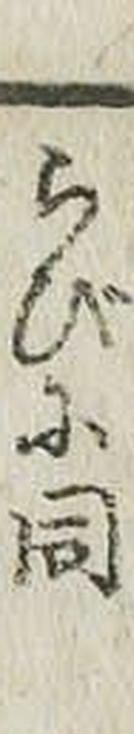らびに同
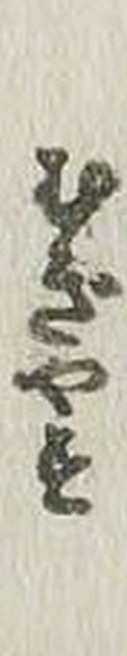むぎやす
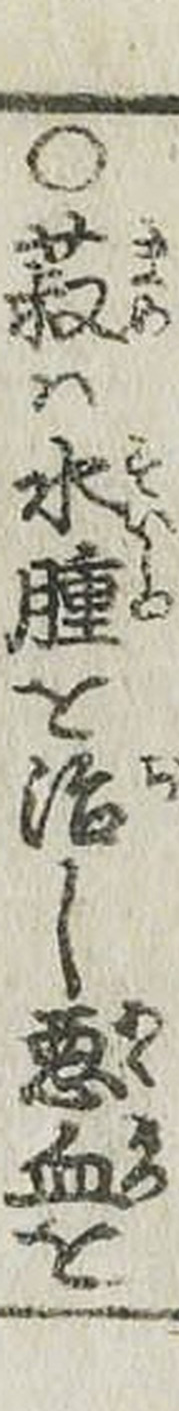○菽は水腫を治し悪血を
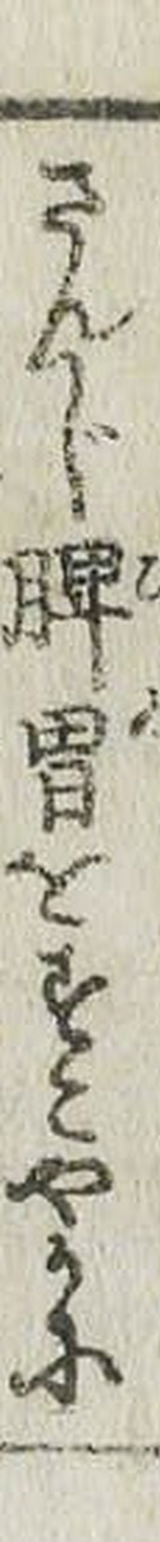さんじ脾胃をすこやかに
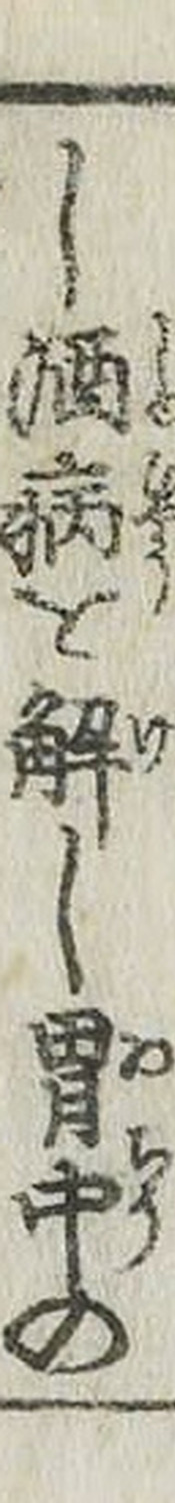し酒病を解し胃中の
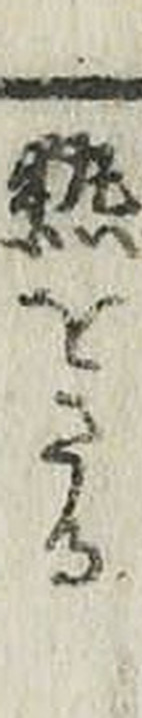熱をさる
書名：増補頭書訓蒙図彙大成 10巻 7:巻之14-16
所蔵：東京学芸大学教育コンテンツアーカイブ
